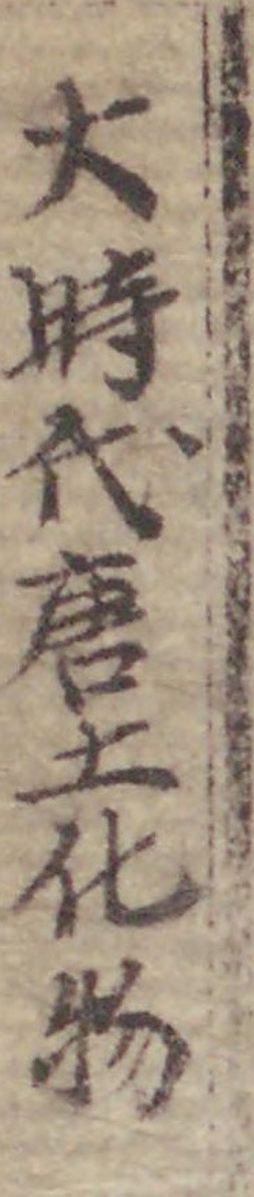大時代唐土化物
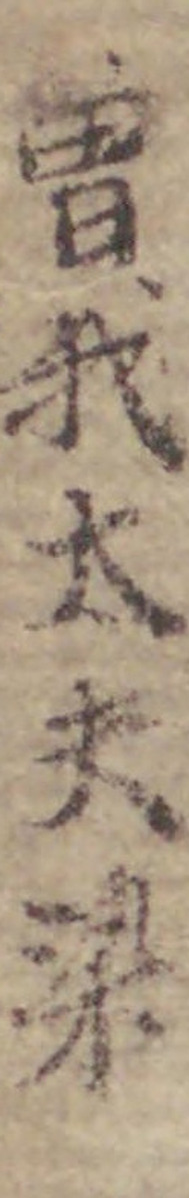曽我太夫染

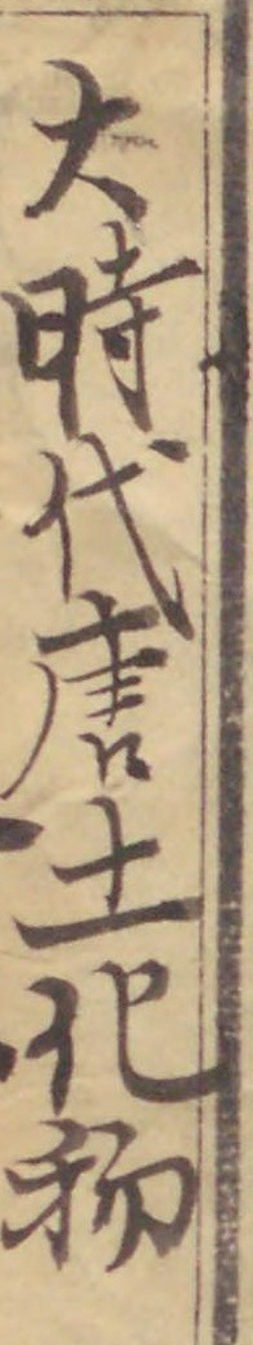大時代唐土化物
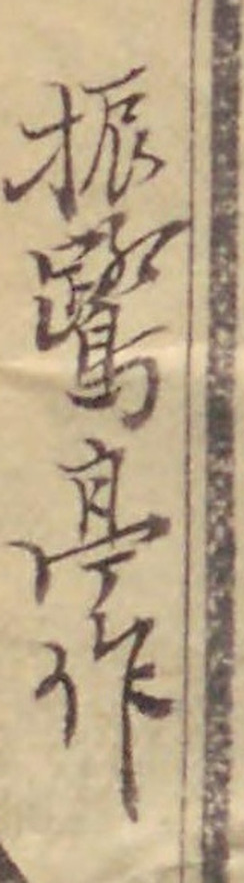振鷺亭作
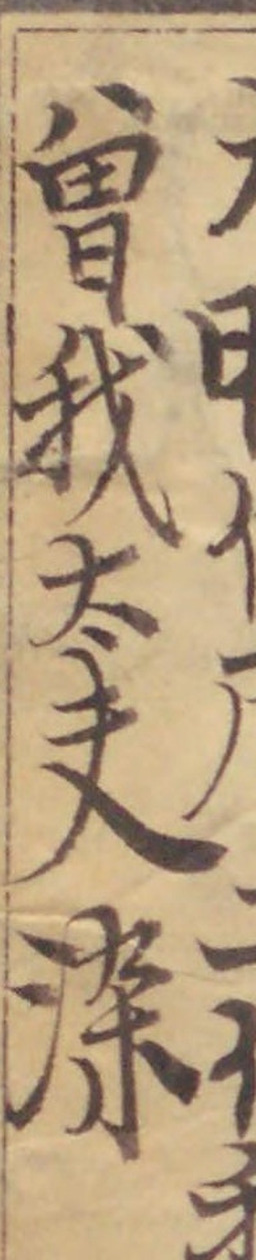曽我大夫染
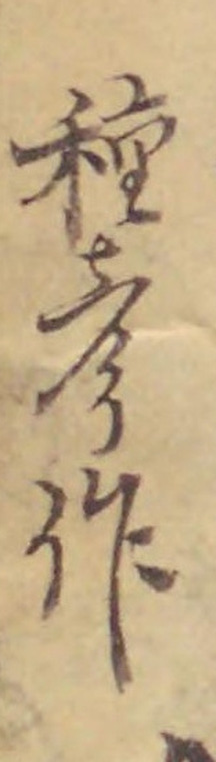種彦作

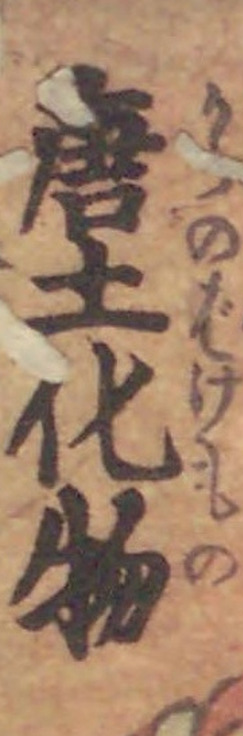唐土化物

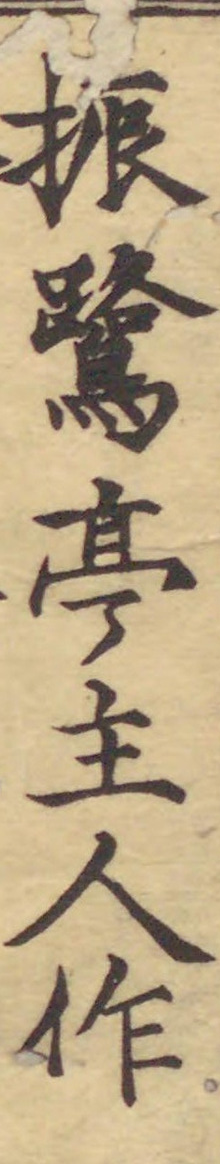振鷺亭主人作
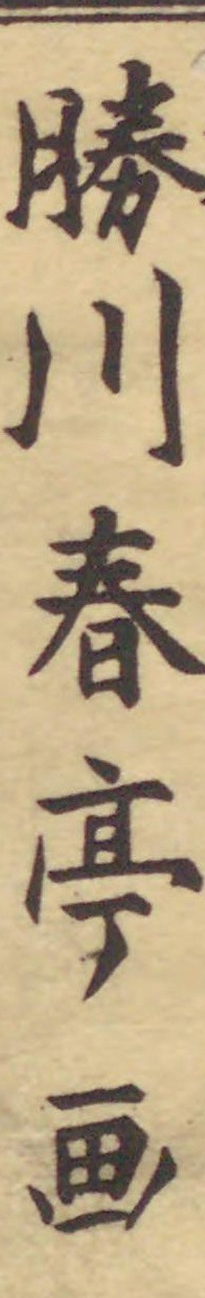勝川春亭画
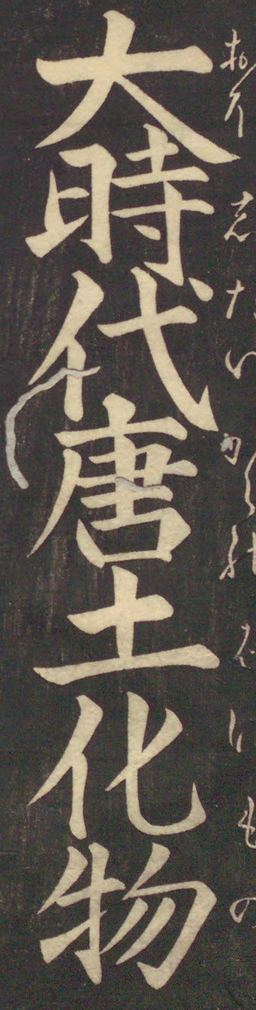大時代唐土化物
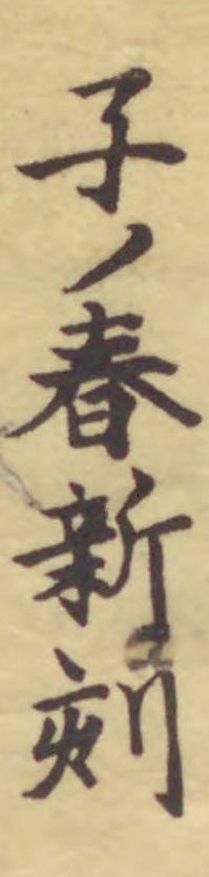子の春新刻
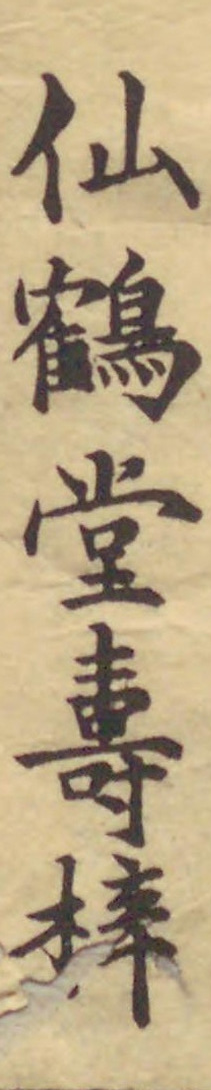仙鶴堂寿梓
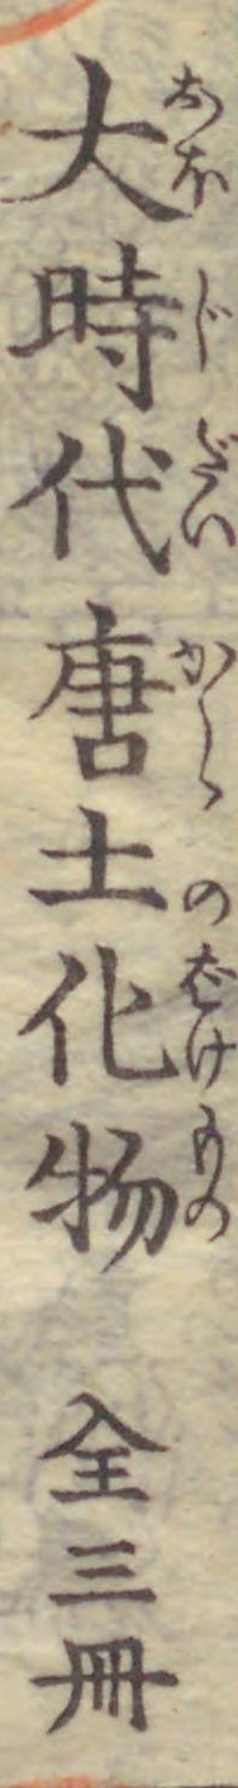大時代唐土化物全三冊
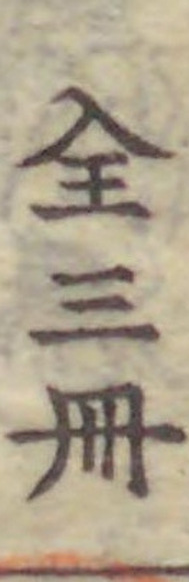全三冊
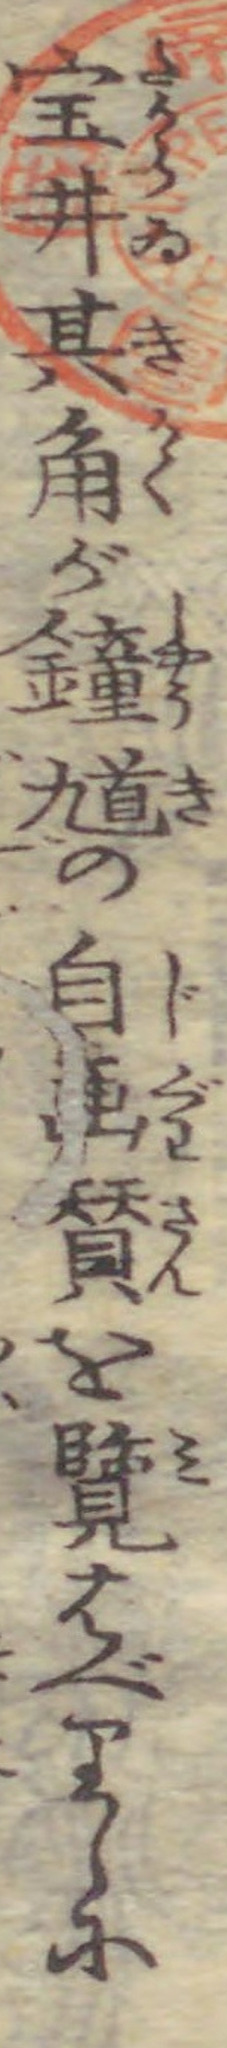宝井其角が鍾馗の自画賛を覧はべりしに
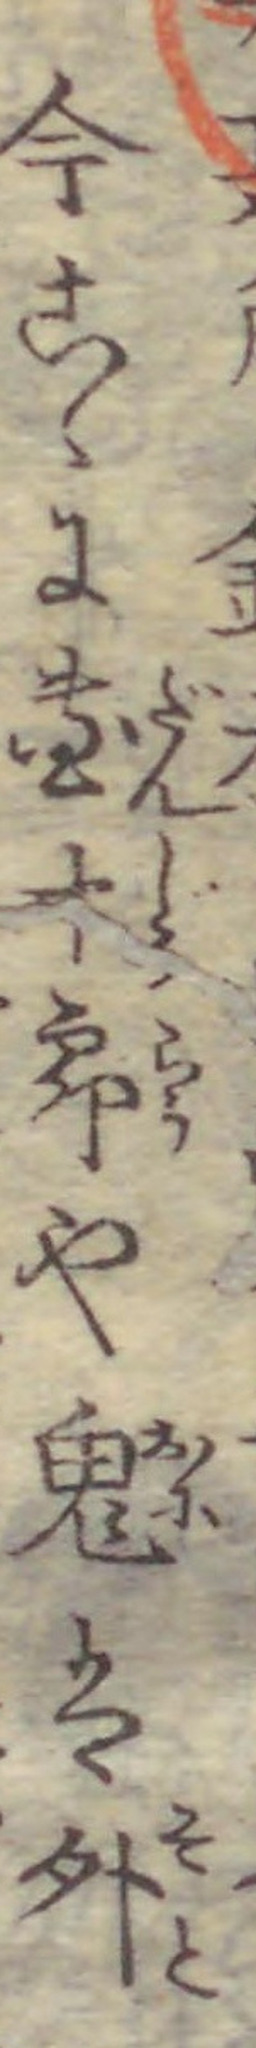今こゝに團十郎や鬼は外
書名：大時代唐土化物 3巻. 曽我太夫染
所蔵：国立国会図書館 National Diet Library, JAPAN
